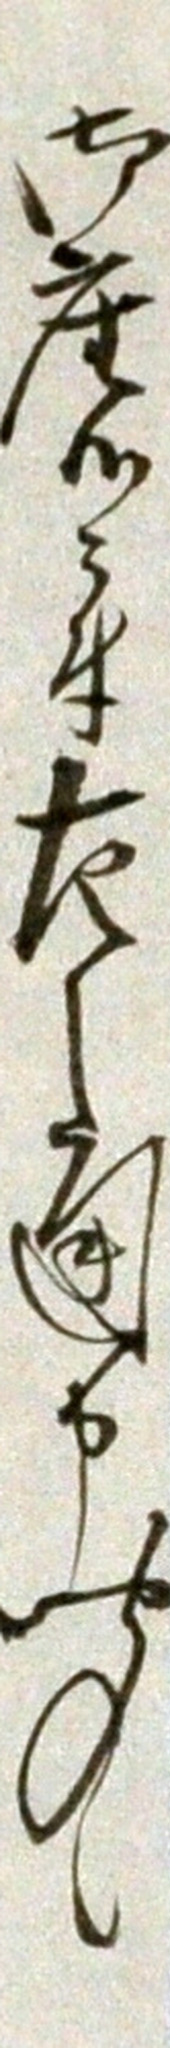御座候ニ付左之通申聞候
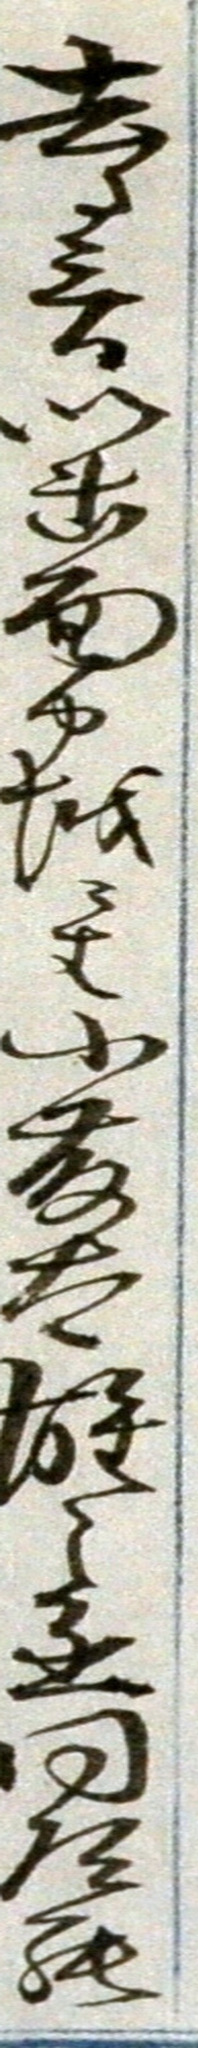去る三日以書面申越ニ者小藤太雄之丞同道罷
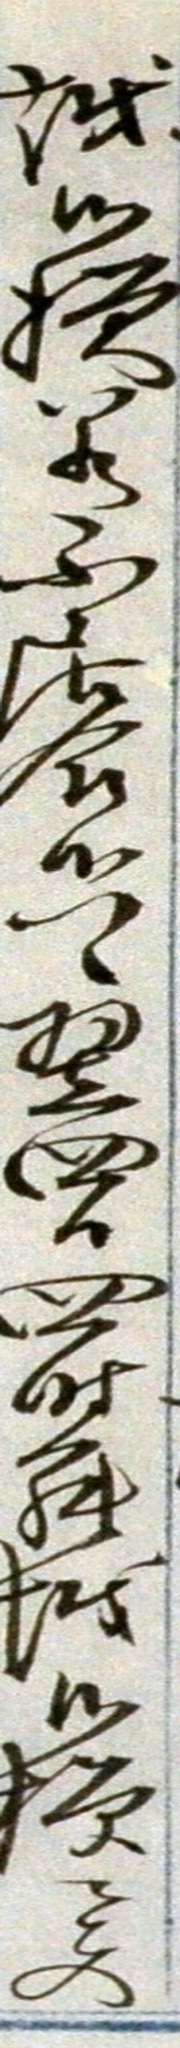越候様若不居合候ハヽ翌四日四時罷越候様ニとの
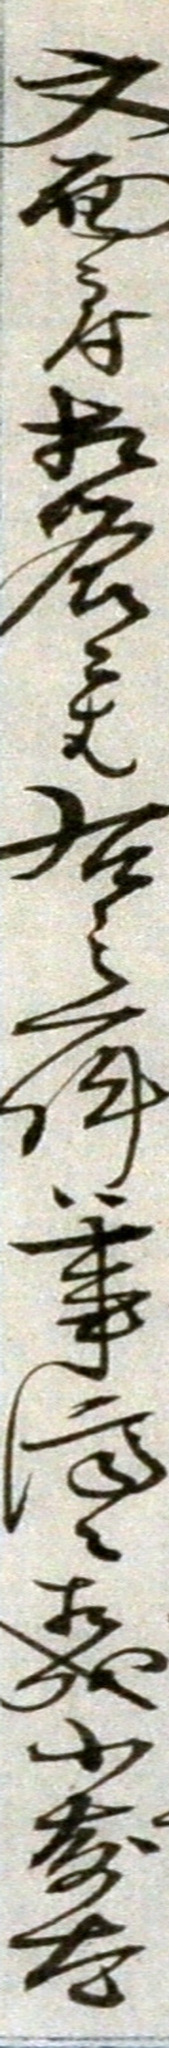文面ニ付相答ニ者右之一件ハ事済ニ相成小藤太
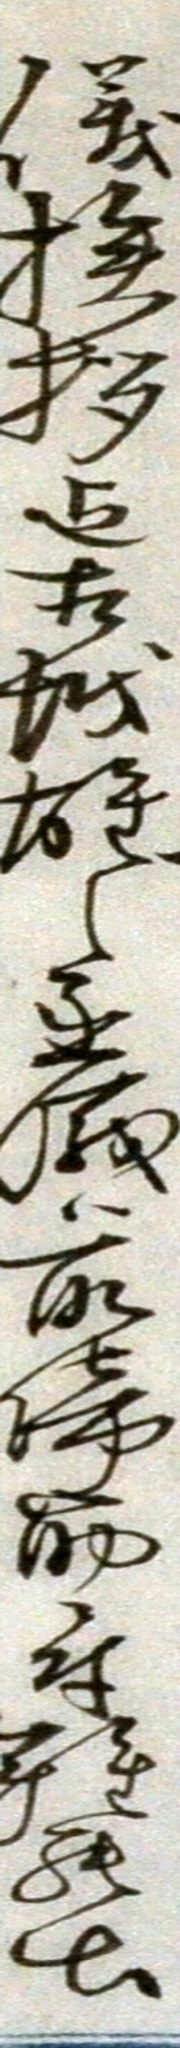儀挨拶迄相越雄之丞儀ハ取締筋ニ付難罷出
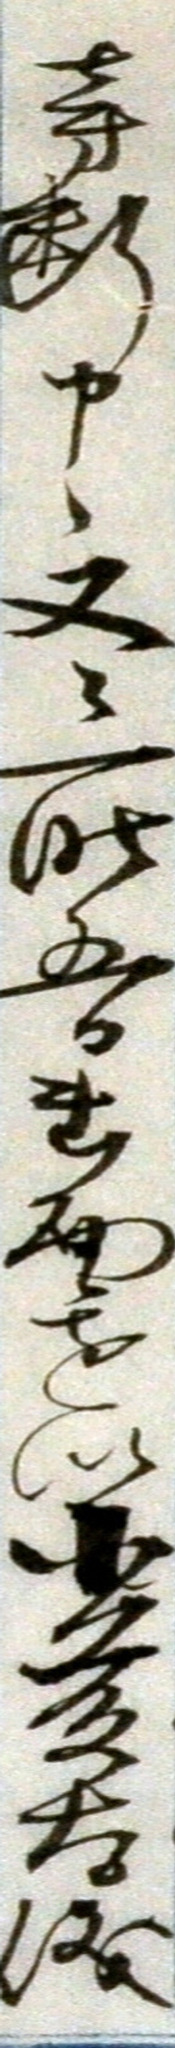旁断申候又々一昨五日書面を以小藤太儀
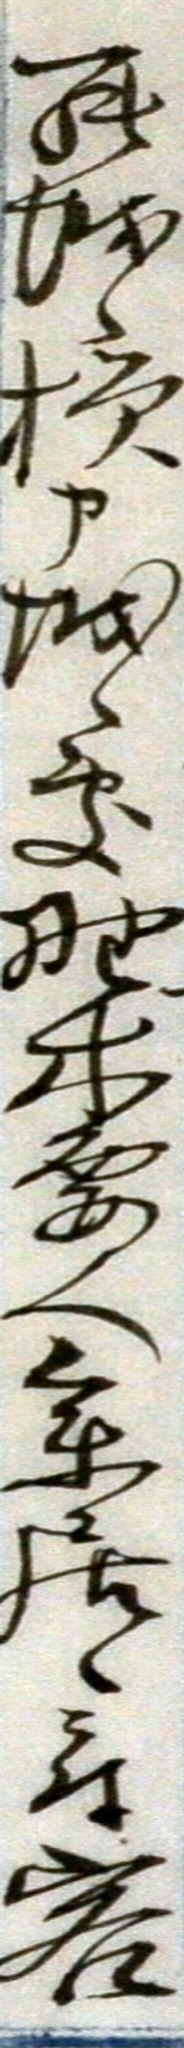罷越候様申越候處野木要人参居候ニ付客
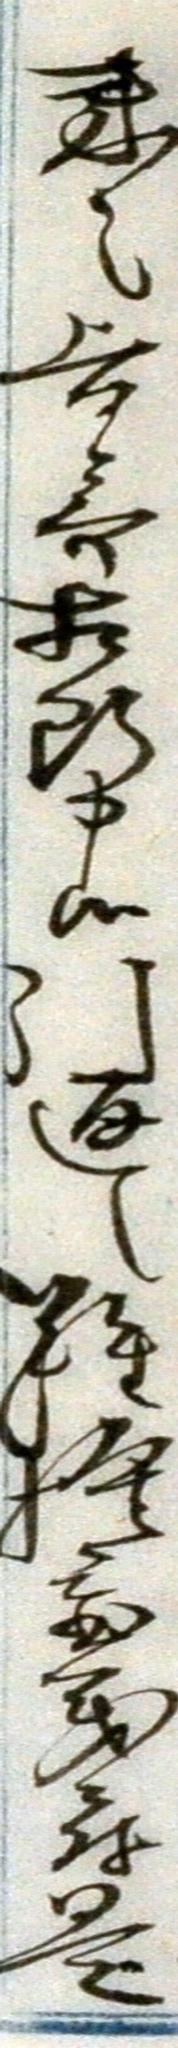来之旨ニ而相断申候引返し難捨置義ニ付是
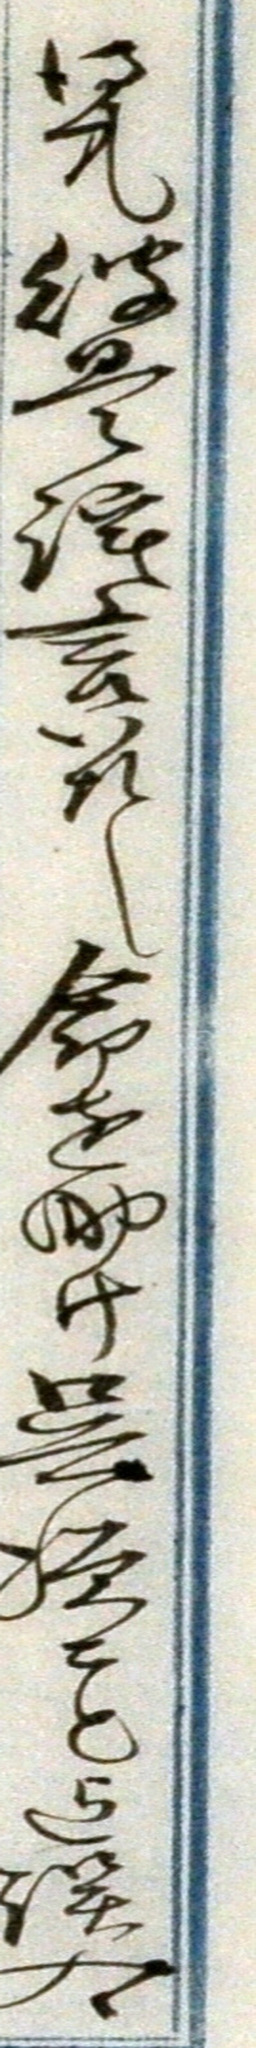得共彼是詫言いたし命を助け呉様ニと迄誤入候
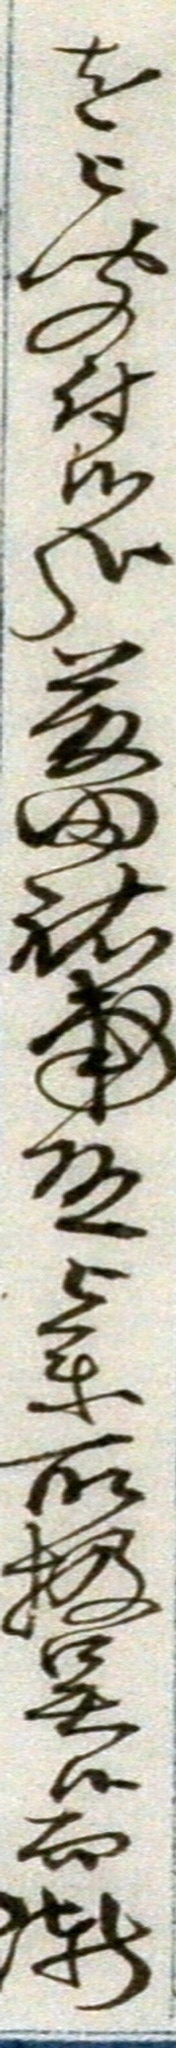を被聞付候哉藤田祐甫殿被参取扱呉候而漸
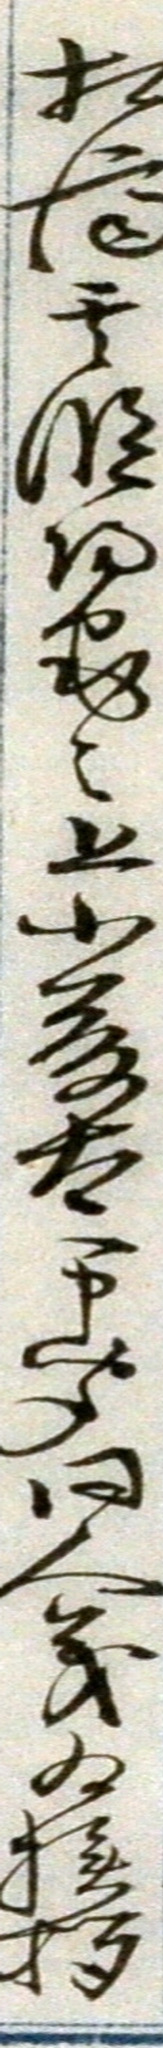相済其段帰宅之上小藤太へ申聞同人義為挨拶
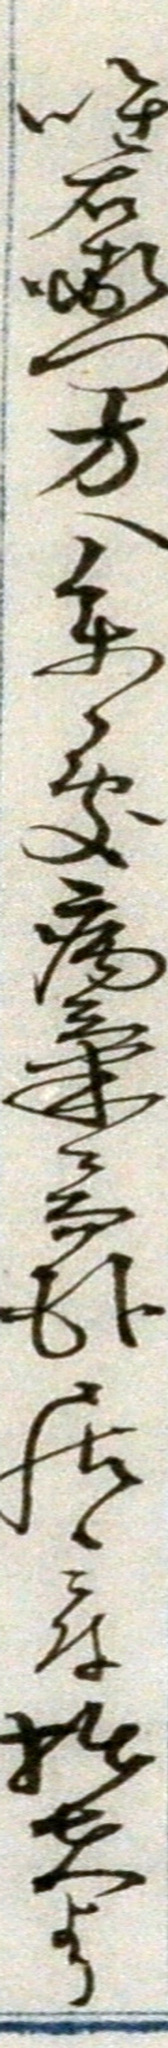唯右衛門方へ参候處病気ニ而臥居候ニ付拙者より
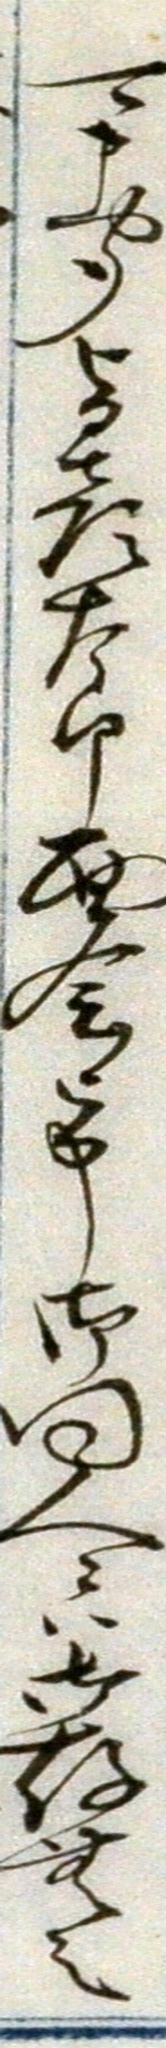可申聞旨彦太郎面会被申御同人ニハ御存無之
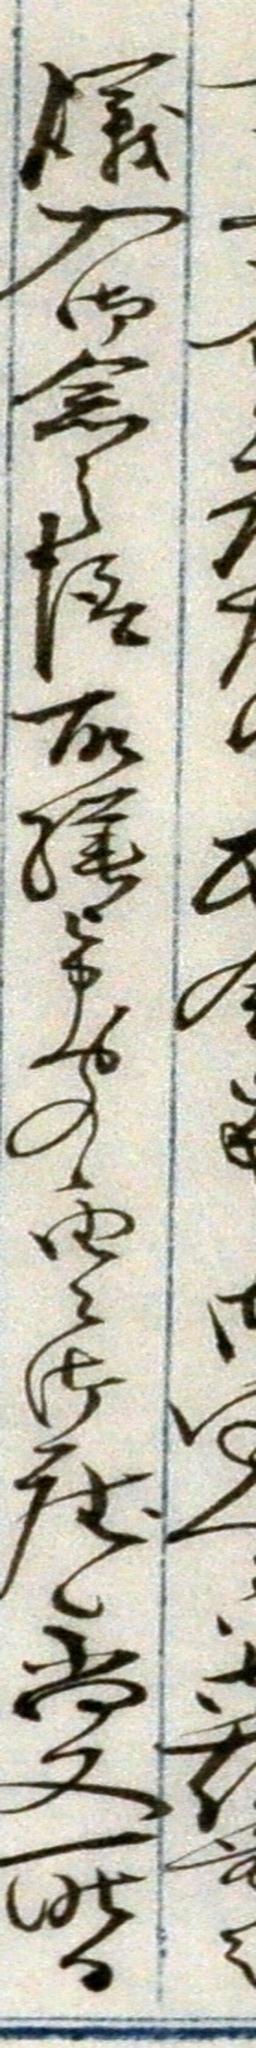儀入御念之趣取繕被申聞候由ニ御座候尚又一昨日
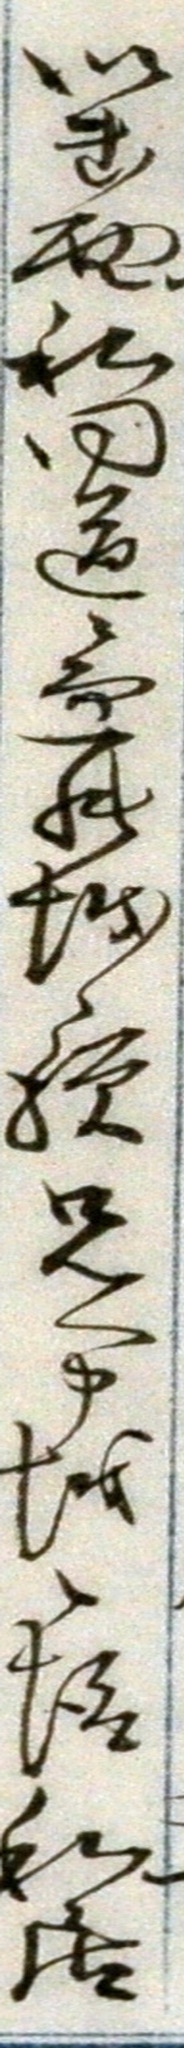以書面私同道ニ而罷越候様兄へ申越候趣私居
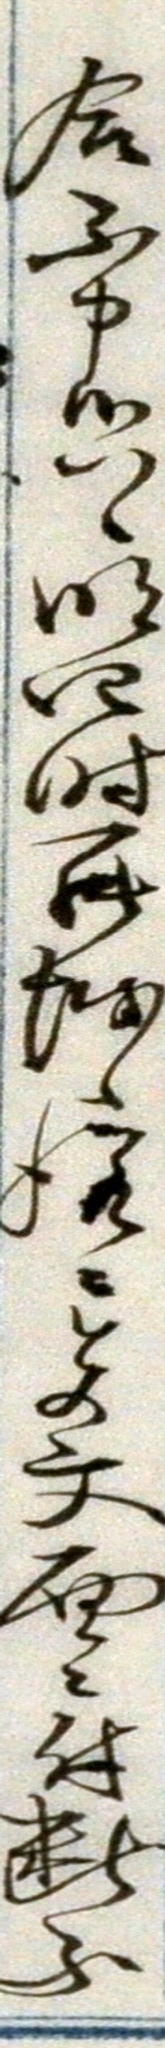合不申候ハヽ明四時罷越候様ニとの文面ニ付断不
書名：川面小藤太子細有之多賀谷唯右衛門ヲ打果候一件
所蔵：伊那市立高遠町図書館・合同会社AMANE
